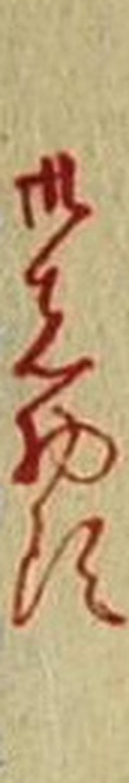御先物頭
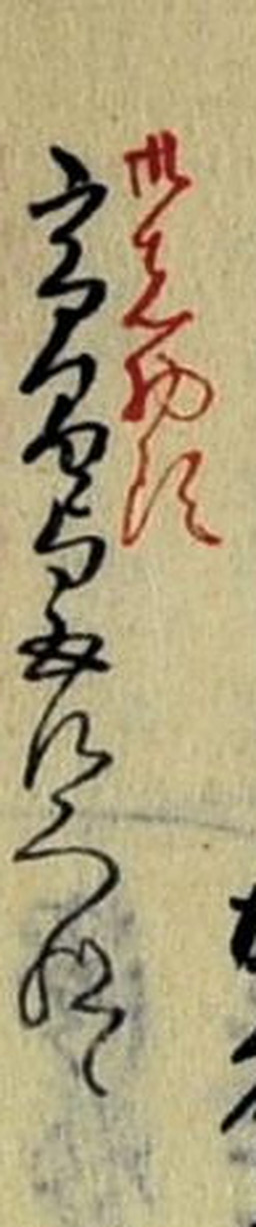高畠与五左衛門組へ
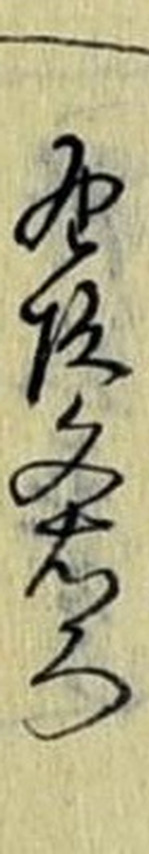野坂文右衛門
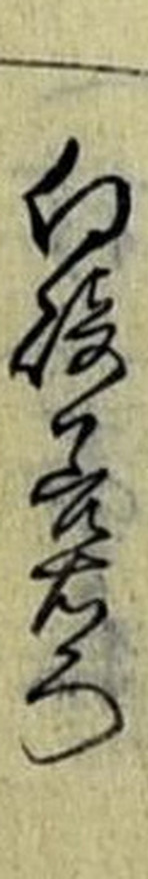白崎善右衛門
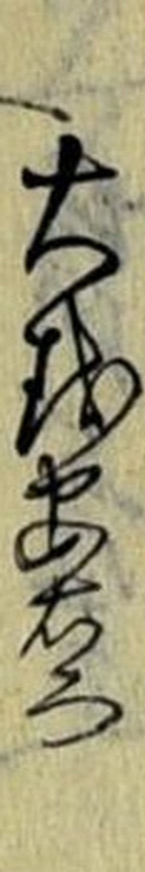大越安右衛門
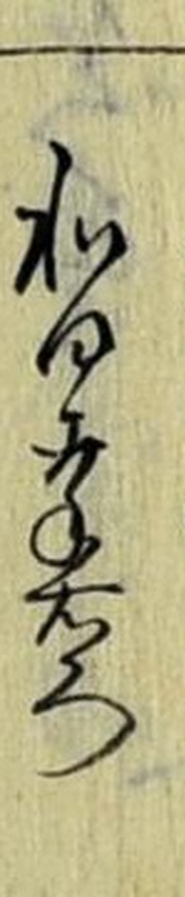和田金右衛門
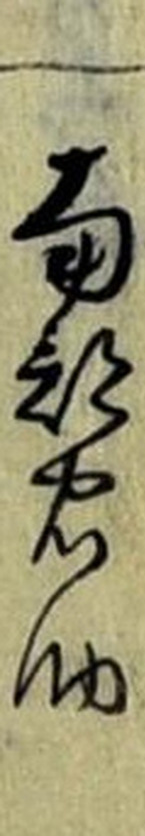南部忠助
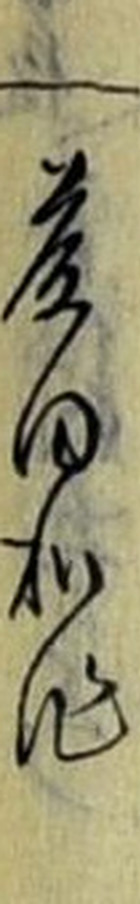藤田和作
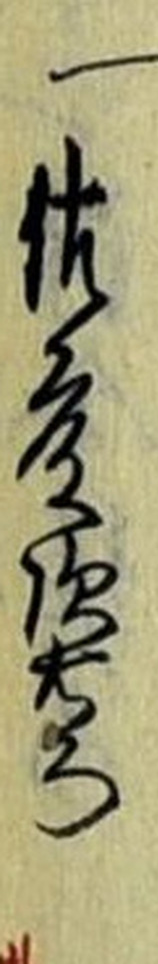佐藤次右衛門
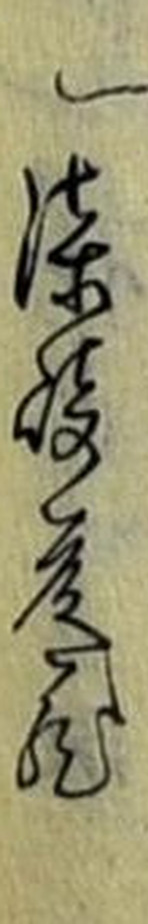漆崎藤蔵
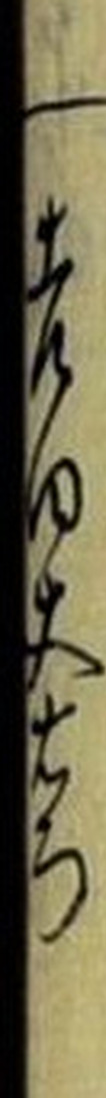吉田丈右衛門
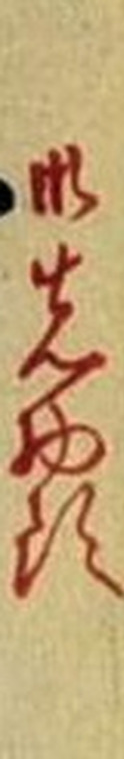御先物頭
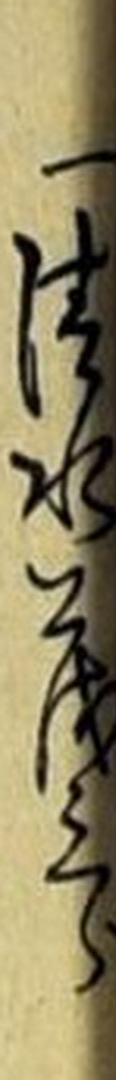清水茂三郎
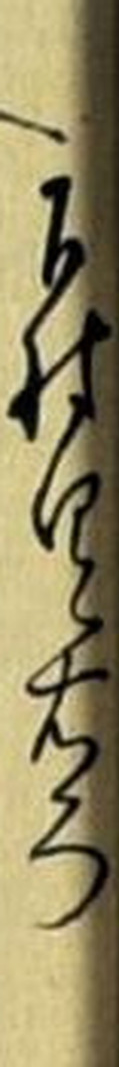下村四郎右衛門
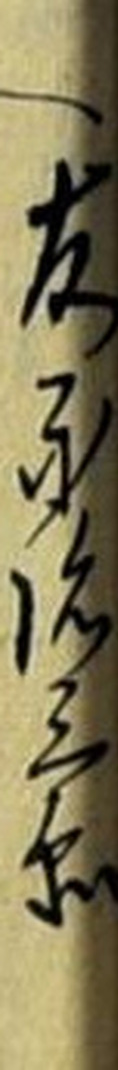友永治兵衛
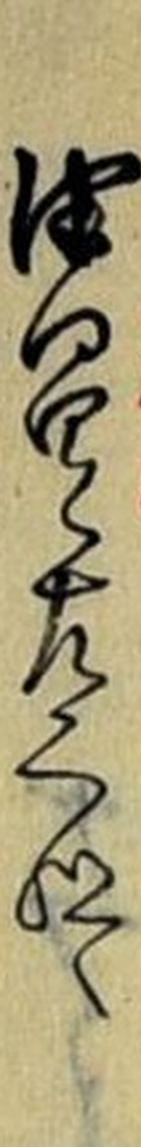津田四郎左衛門組へ
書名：命令之部 四
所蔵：福井県文書館 Fukui Prefectural Archives
